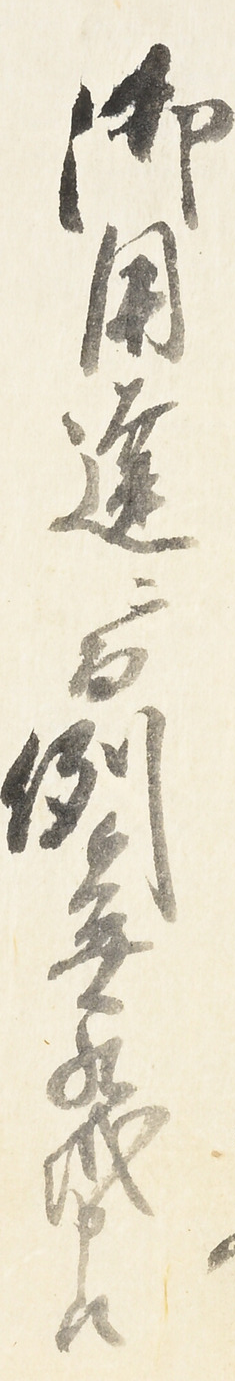御用達ニ而例年罷越申候
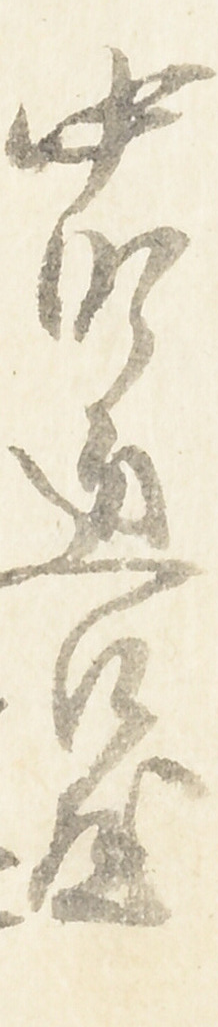中町近江屋
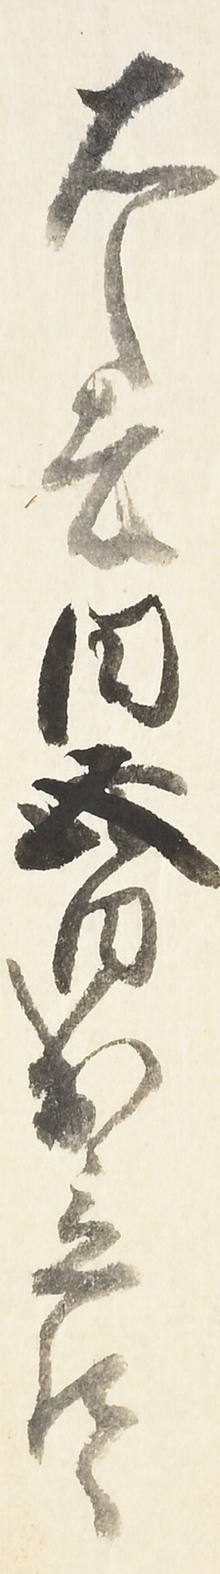右之者同五日出立仕候
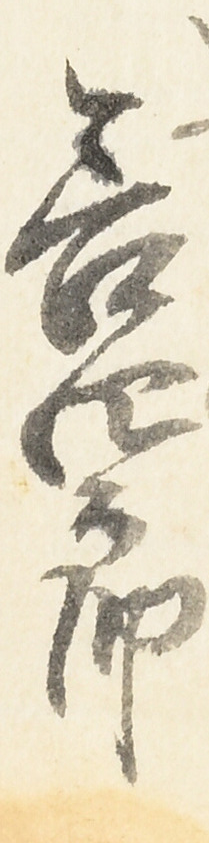善四郎
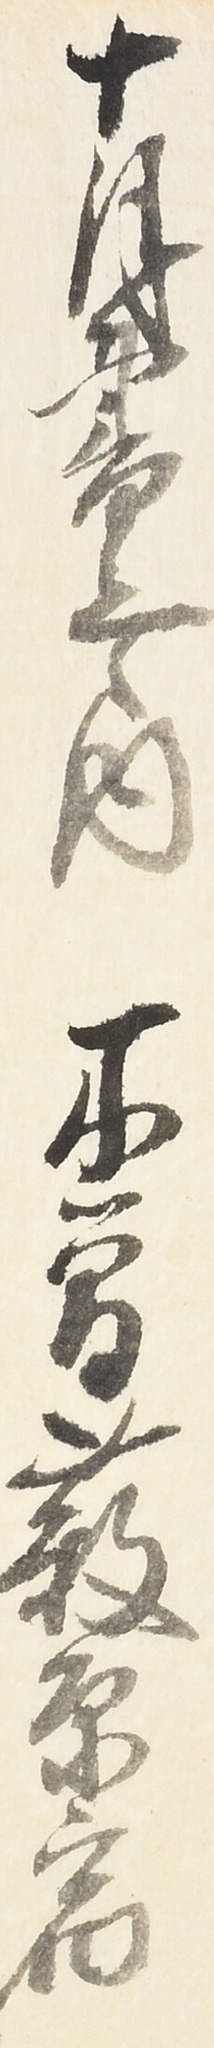十月書上之内木曽藪原宿
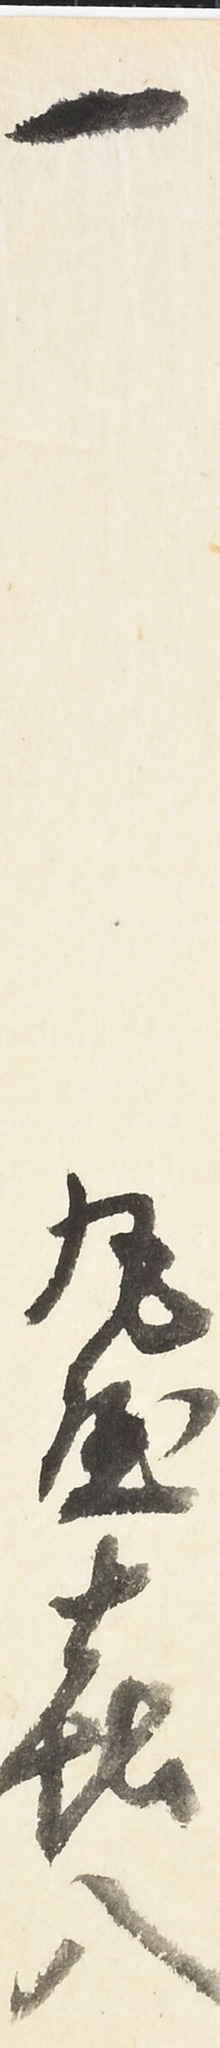一丸屋喜八
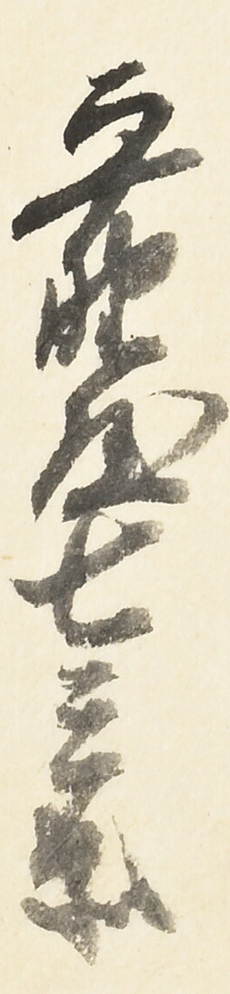平野屋七兵衛
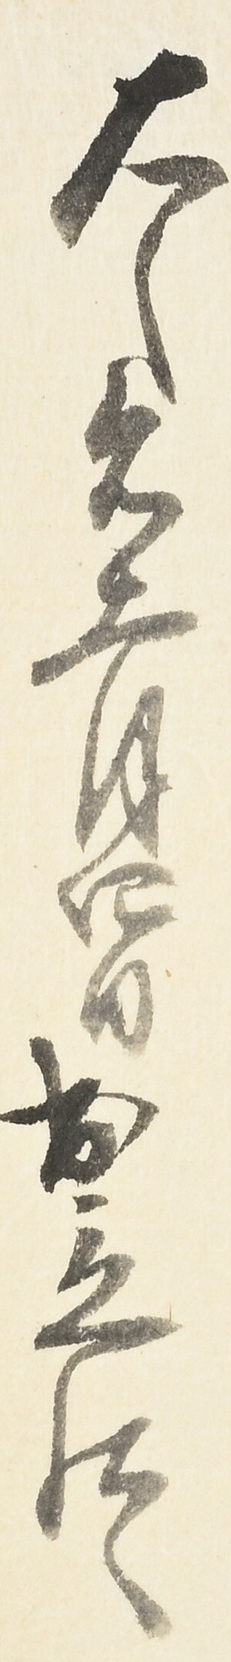右之者十一月四日出立仕候
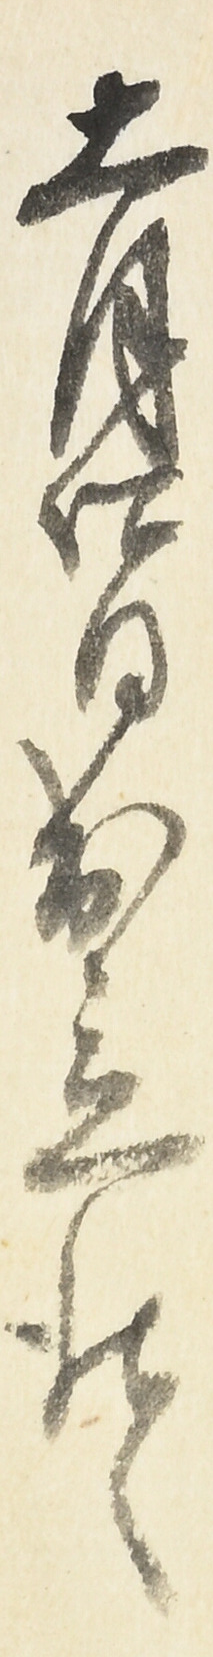十一月四日出立仕候
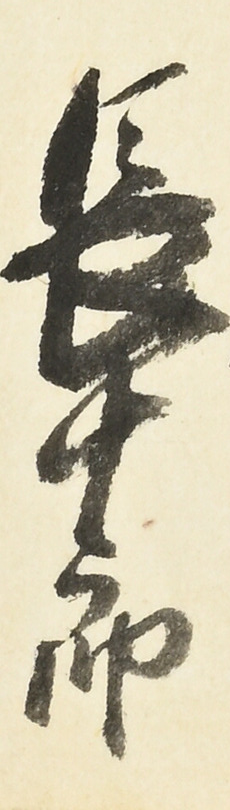長十郎

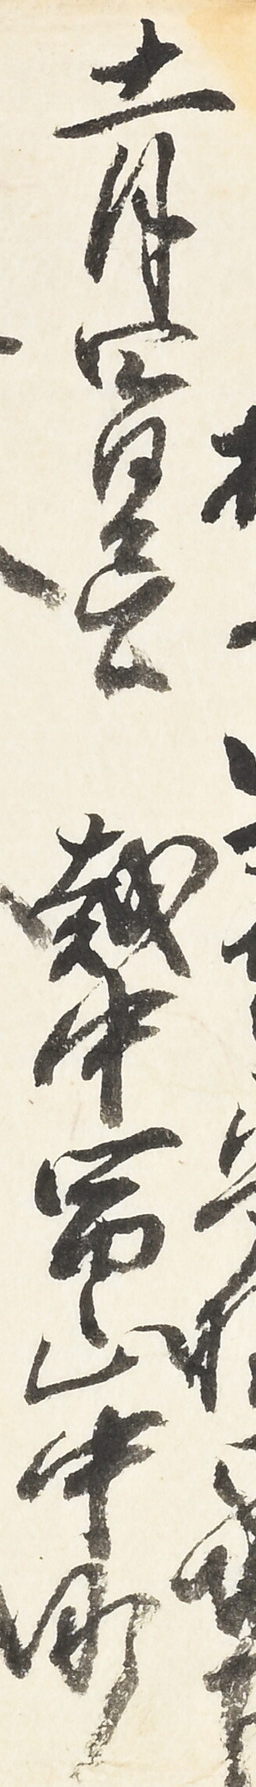十一月四日着越中冨山中町
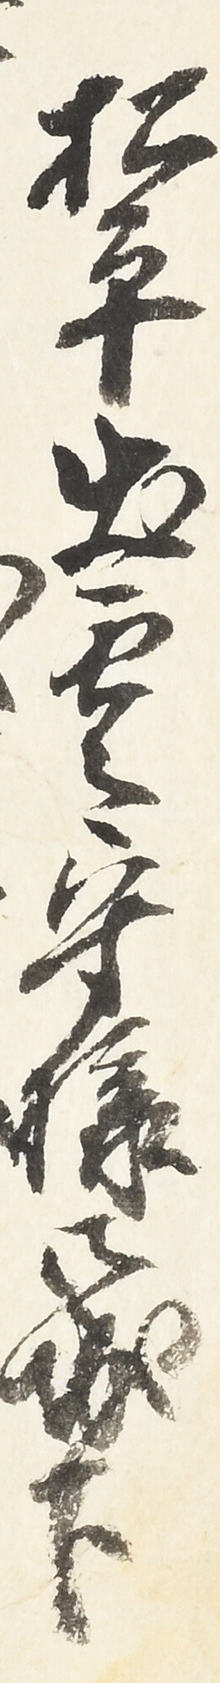松平出雲守様御城下
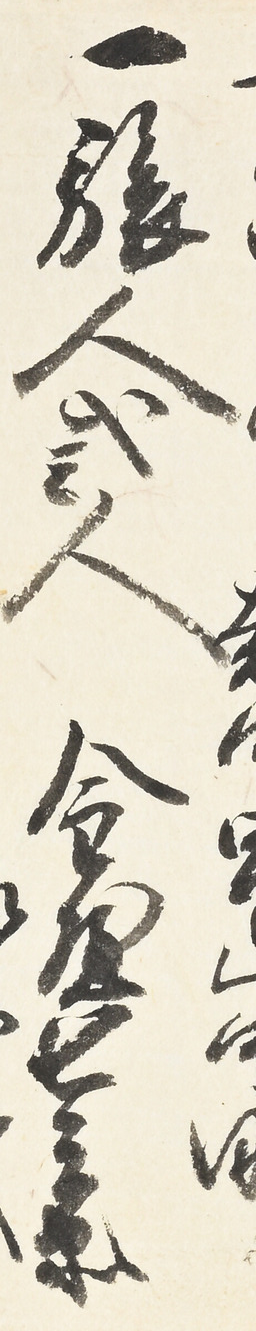一旅人弐人金屋七兵衛
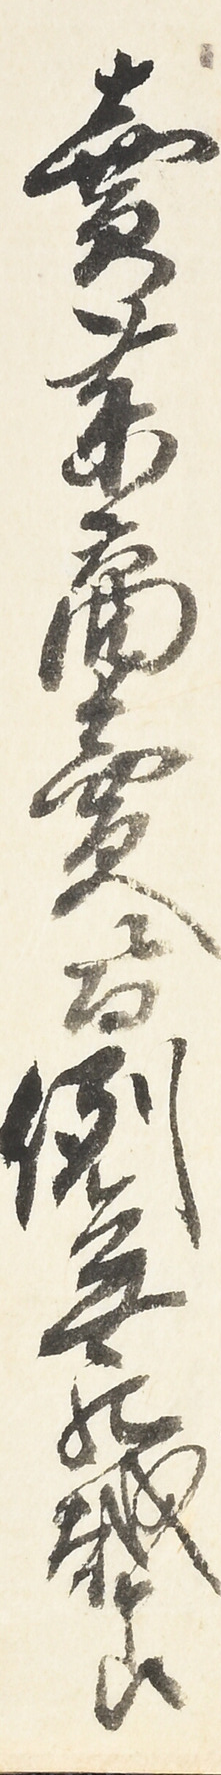売薬商売ニ而例年罷越申候
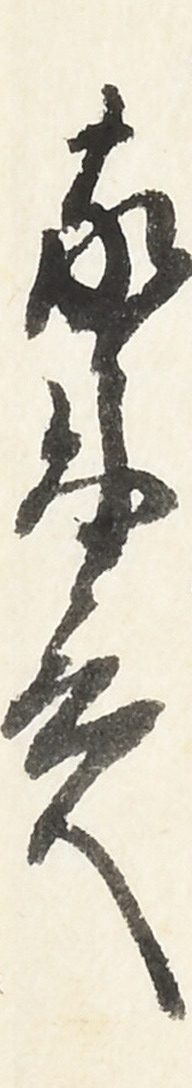家来壱人
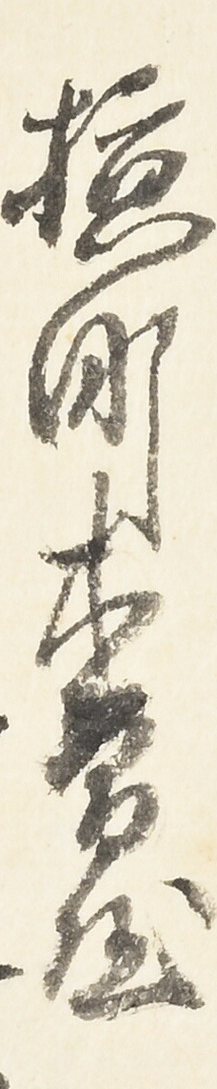横町木曽屋
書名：町中旅人泊控帳
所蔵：伊那市立高遠町図書館・合同会社AMANE
